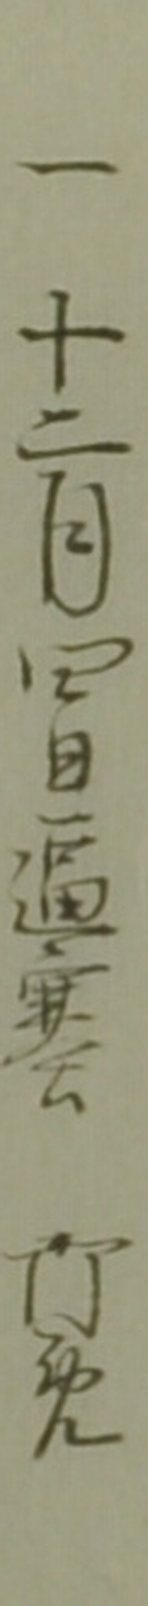一十二月四日逼塞御免
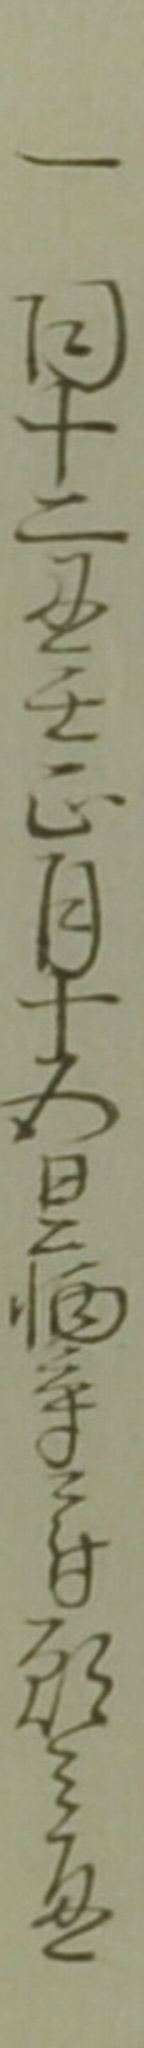一同十二丑閏正月十五日病気ニ付願之通
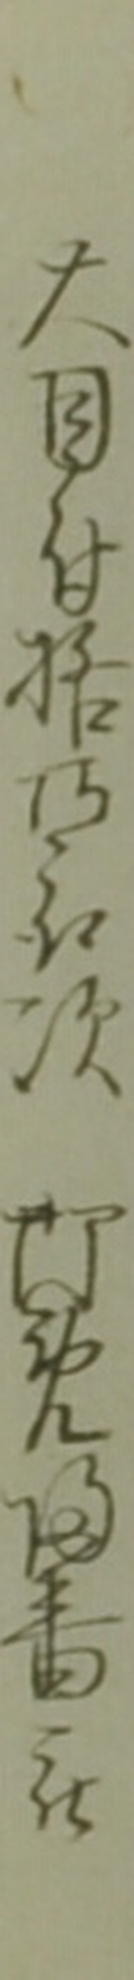大目付格御取次御免帰番被
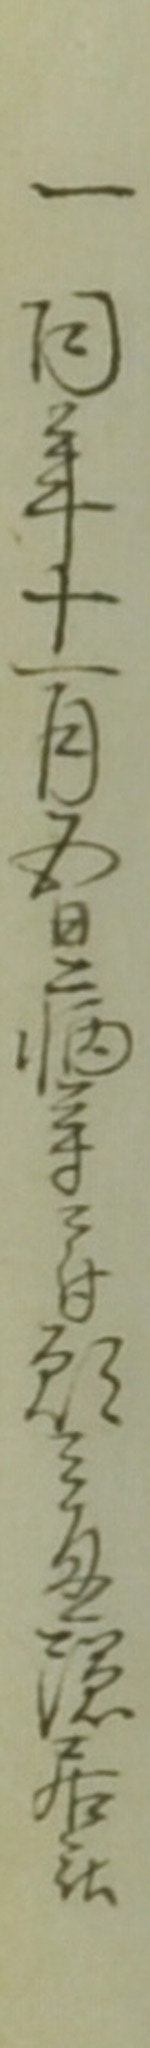一同年十一月五日病気ニ付願之通隠居被

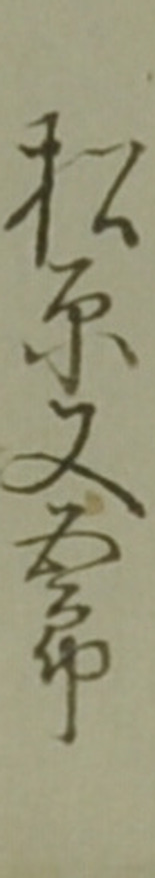松原又五郎
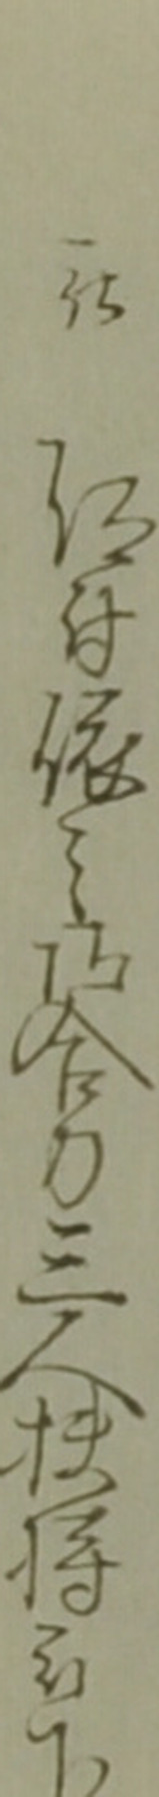被仰付依之御合力三人扶持被下之
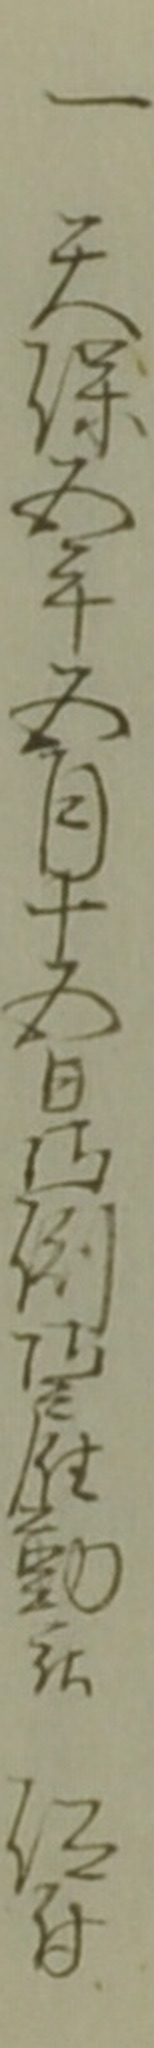一天保五午五月十三日御小道具方被仰付
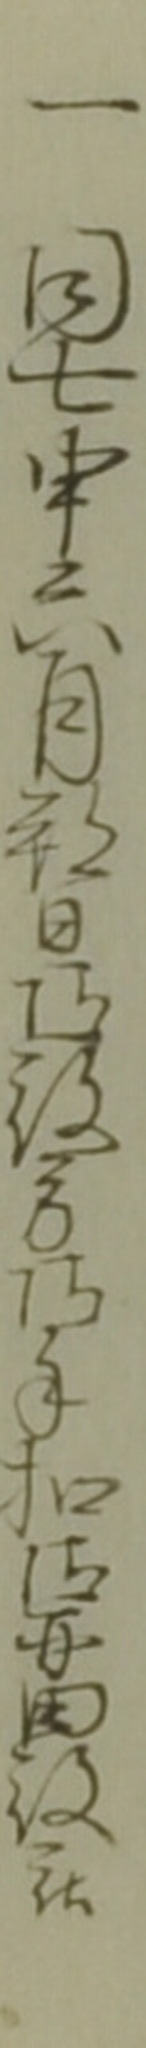一同七申六月朔日御役方御手控御留役被
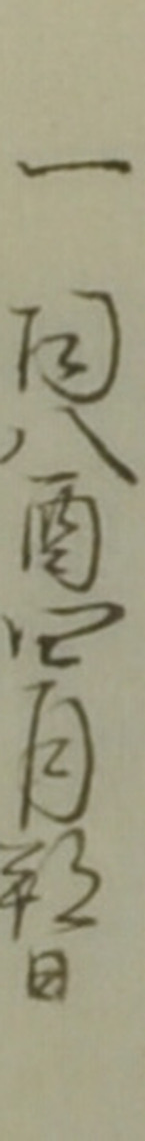一同八酉四月朔日
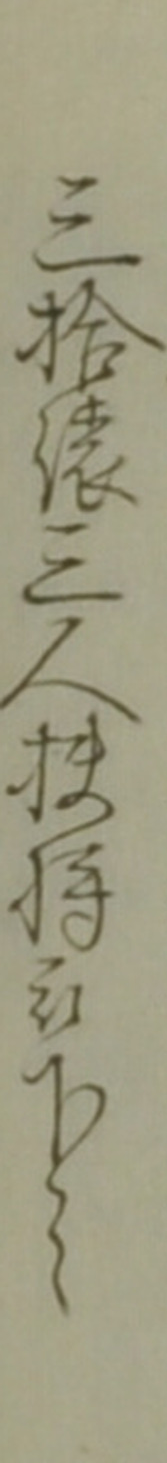三拾俵三人扶持被下之
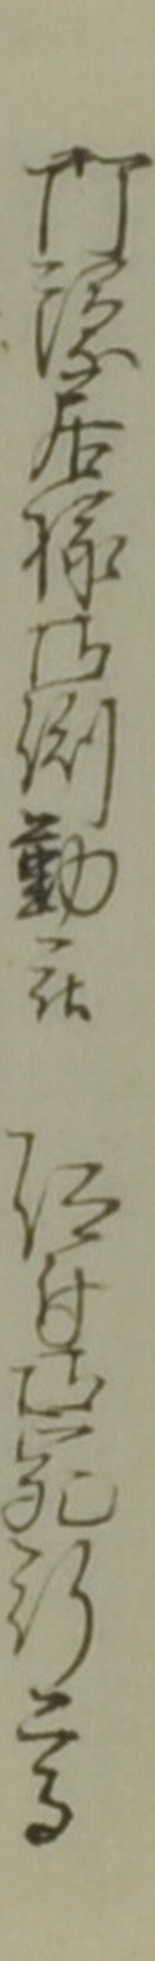御隠居御側勤被仰付御宛行高
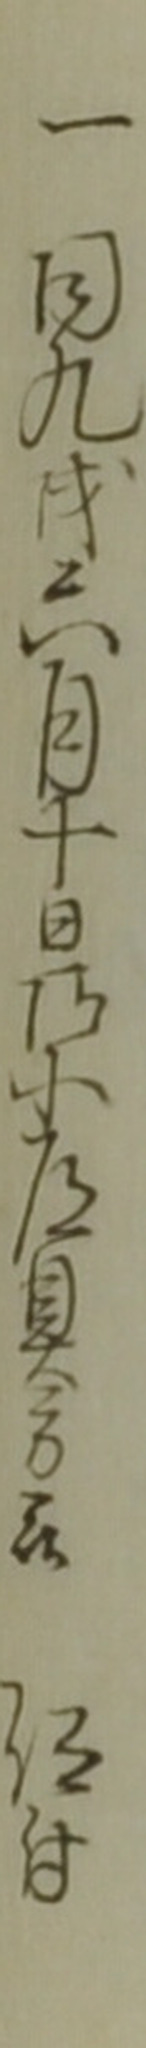一同九戌六月十日御小道具方被仰付
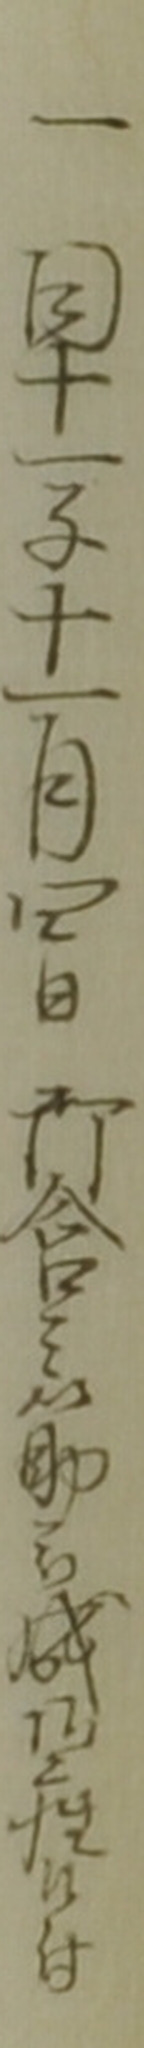一同十一子十一月四日御含之筋被成御座候付
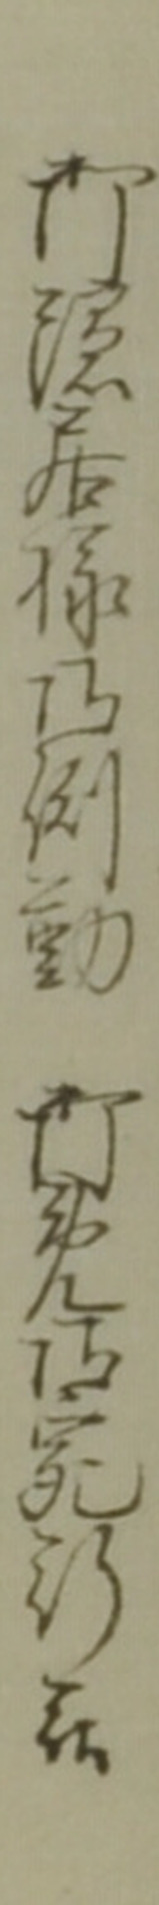御隠居様御側勤御免御宛行被
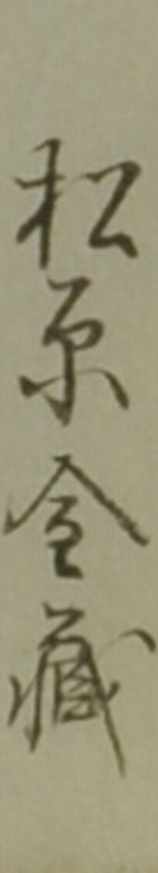松原金蔵
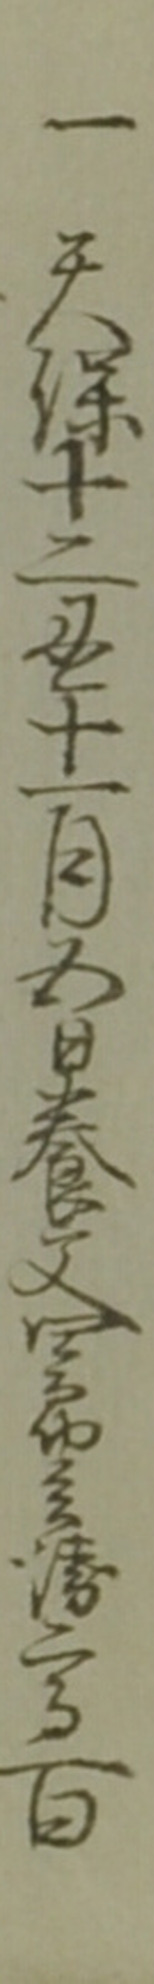一天保十二丑十一月五日養父四郎兵衛高百
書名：給人諸士勤仕録（三）
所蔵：伊那市立高遠町図書館・合同会社AMANE
